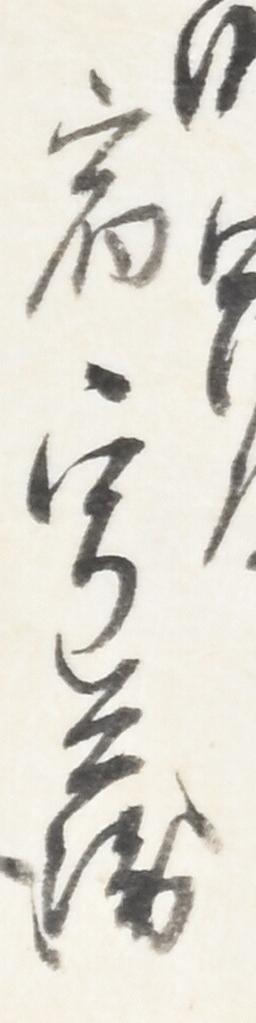宿宇兵衛
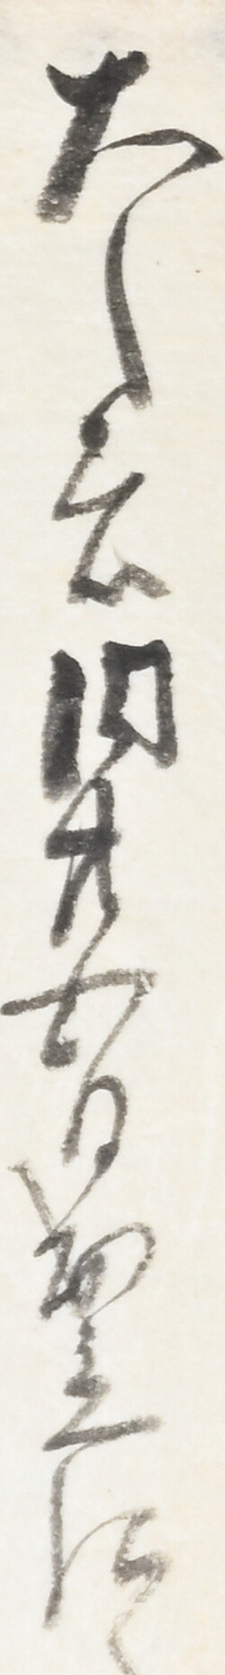右之者同廿五日出立仕候
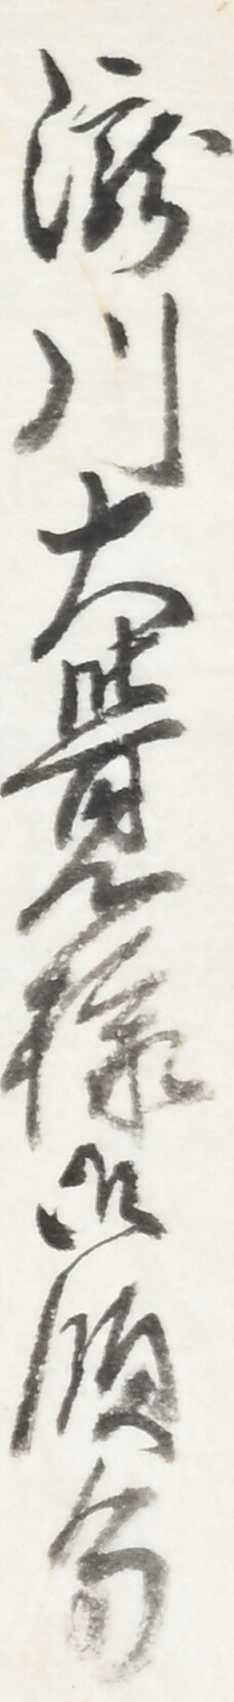瀧川大覚様御領分
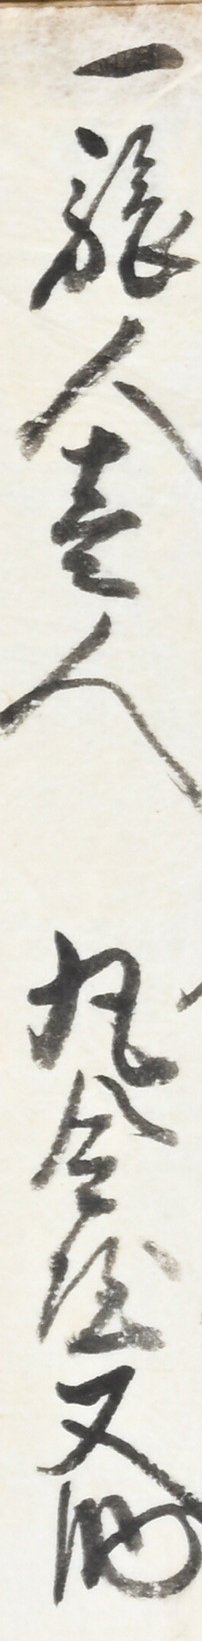一旅人壱人丸金屋又助

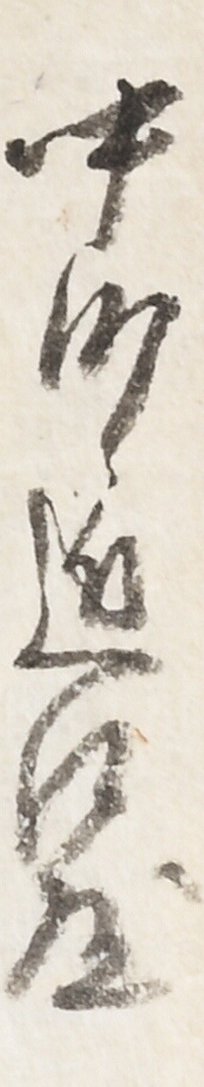中町近江屋
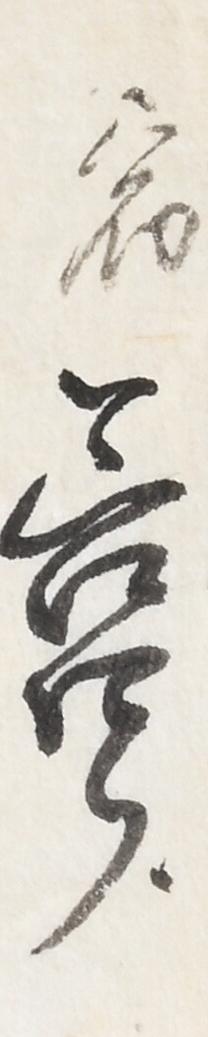宿善四郎
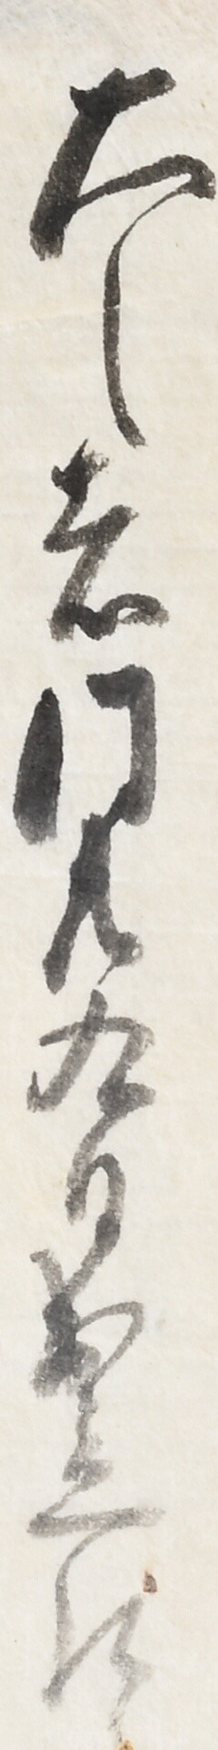右之者同廿九日出立仕候
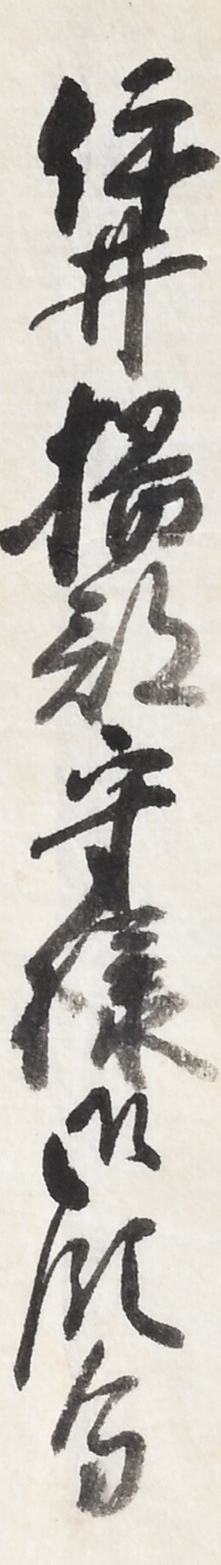井伊掃部守様御領分
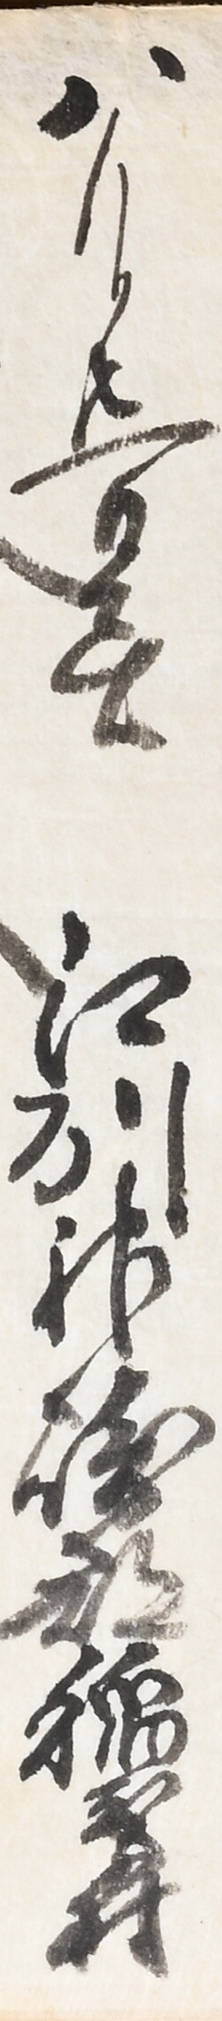八月廿一日着江州神崎郡稲葉村
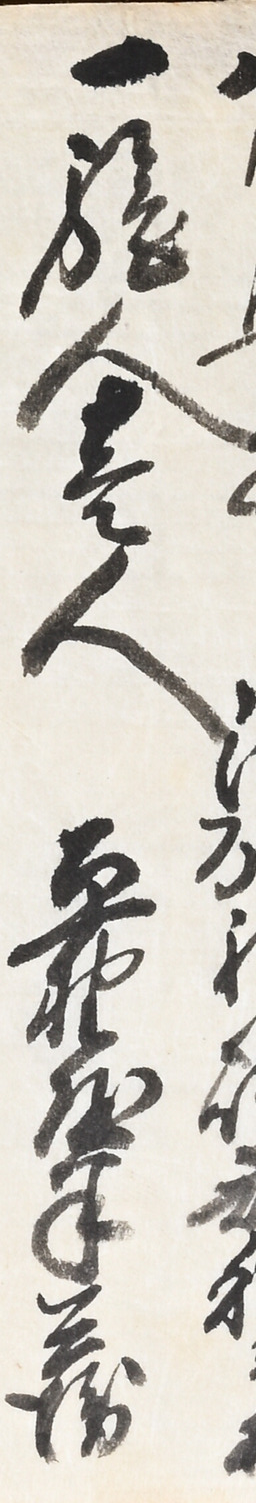一旅人壱人平野屋半兵衛
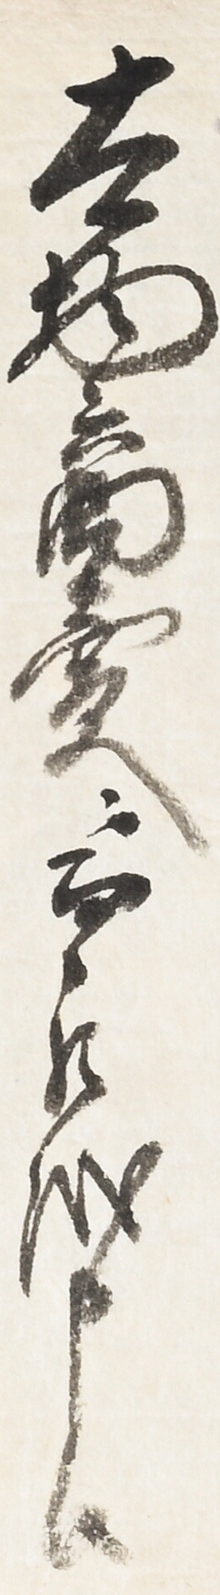太物商売ニ而罷越申候
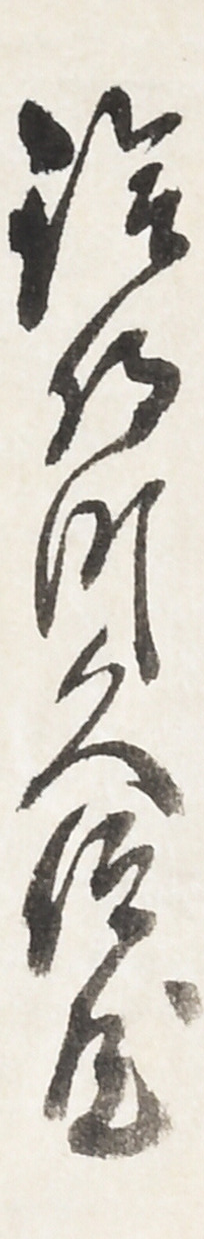鉾持町久住屋
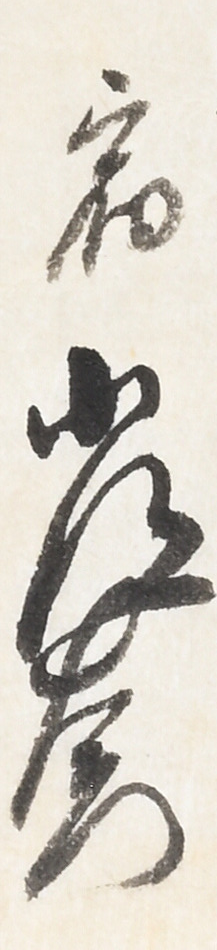宿常右衛門
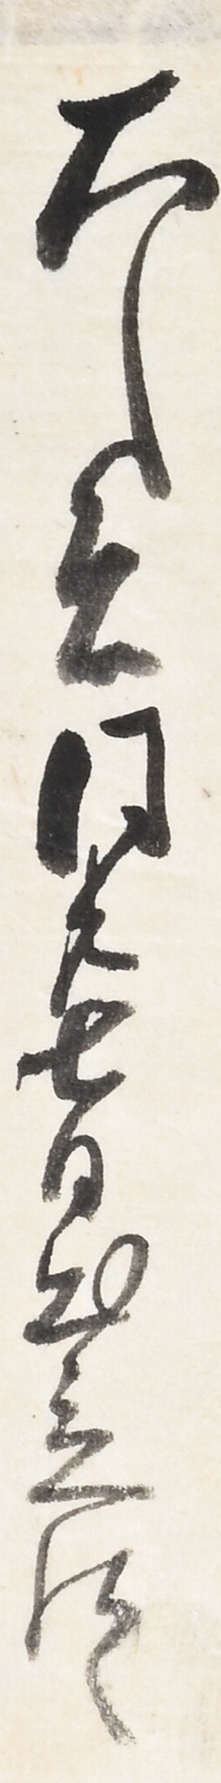右之者同廿七日出立仕候
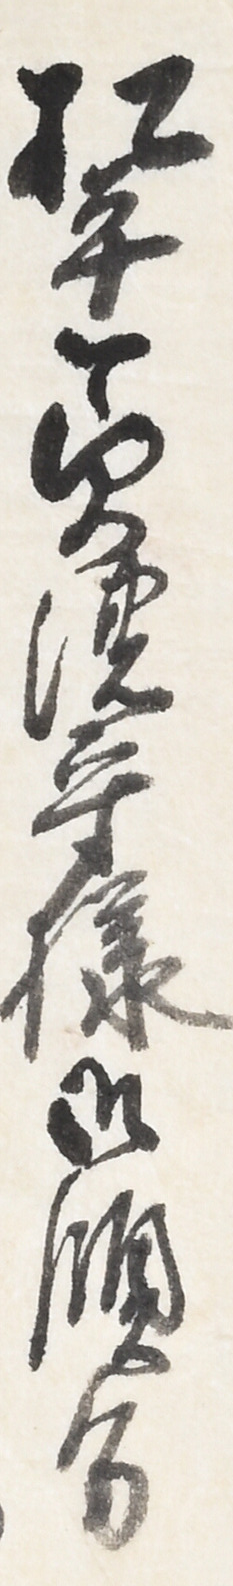松平美濃守様御領分
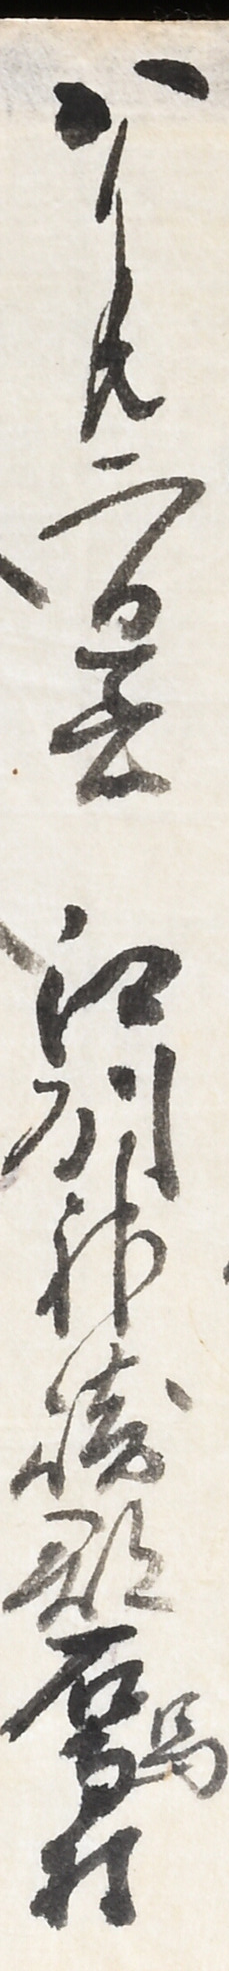八月廿一日着江州神崎郡稲葉村
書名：旅人泊控帳
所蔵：伊那市立高遠町図書館・合同会社AMANE
